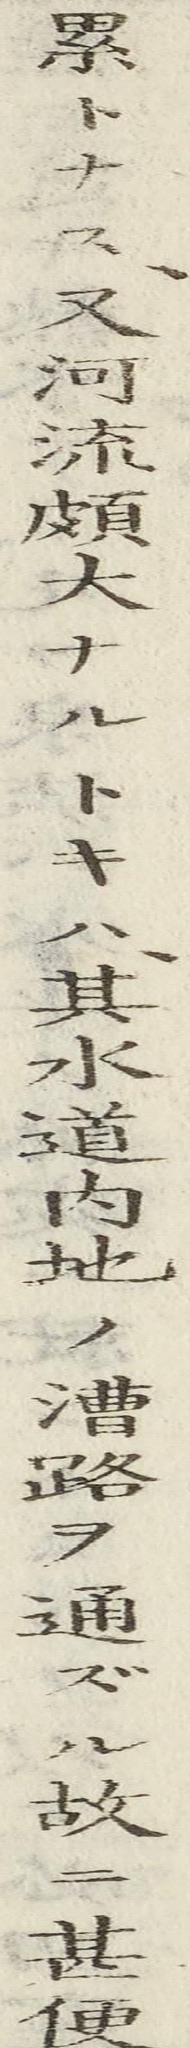累トナス、又河流頗大ナルトキハ、其水道内地ノ漕路ヲ通ズル故ニ其便
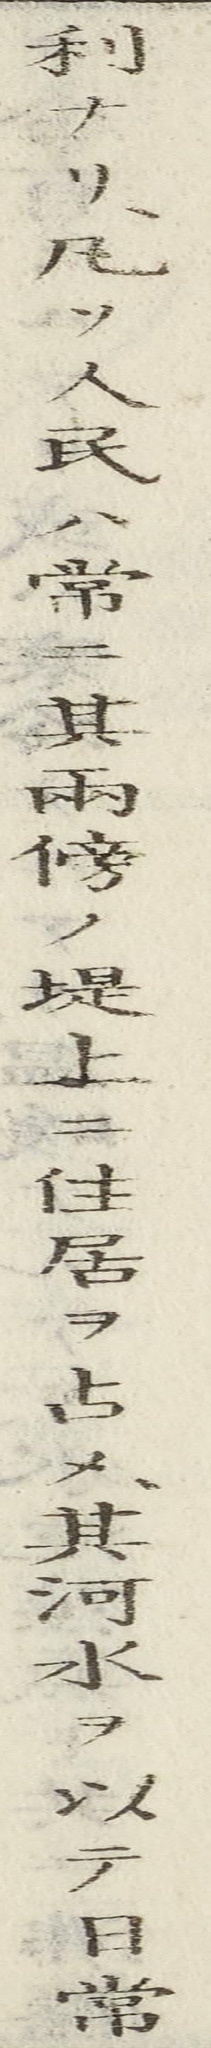利ナリ、凡ソ人民ハ常ニ其両傍ノ堤上ニ住居ヲ占メ、其河水ヲ以テ日常
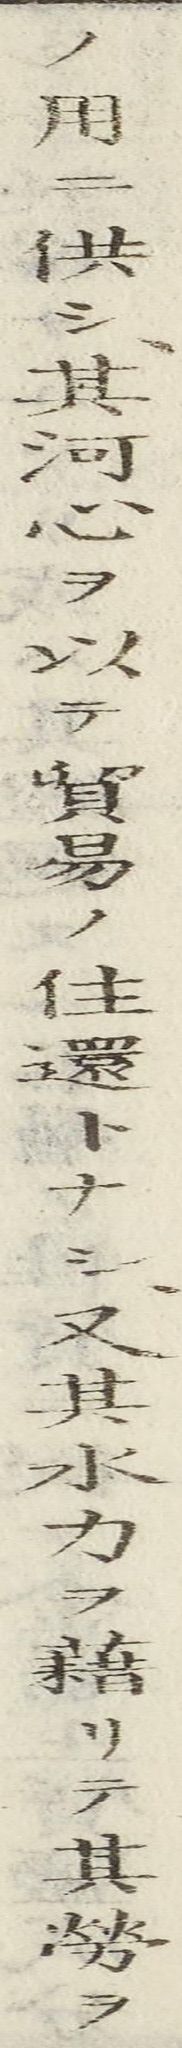ノ用ニ供シ、其河心ヲ以テ貿易ノ往還トナシ、又其水力ヲ藉リテ其労ヲ
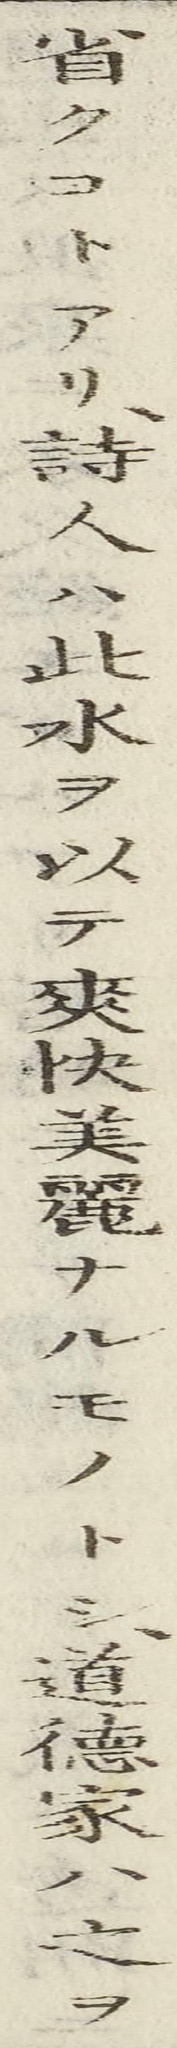省クコトアリ、詩人ハ此水ヲ以テ爽快美麗ナルモノトシ、道徳家ハ之ヲ
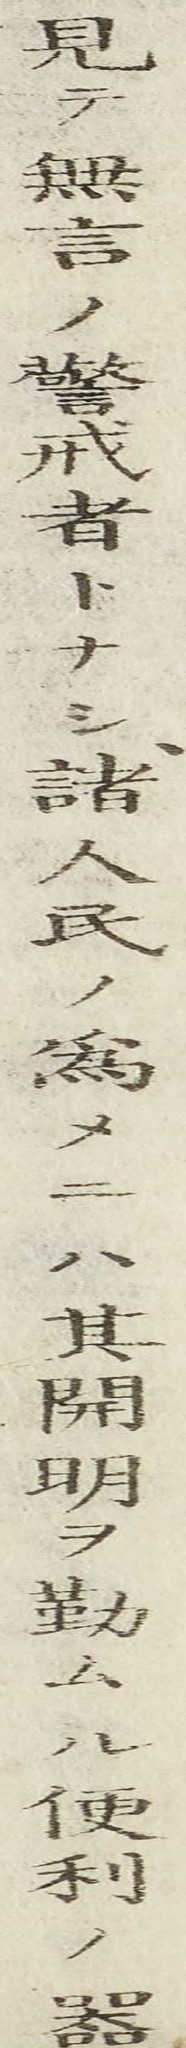見テ無言ノ警戒者トナシ、諸人民ノ為メニハ其開明ヲ勤ムル便利ノ器
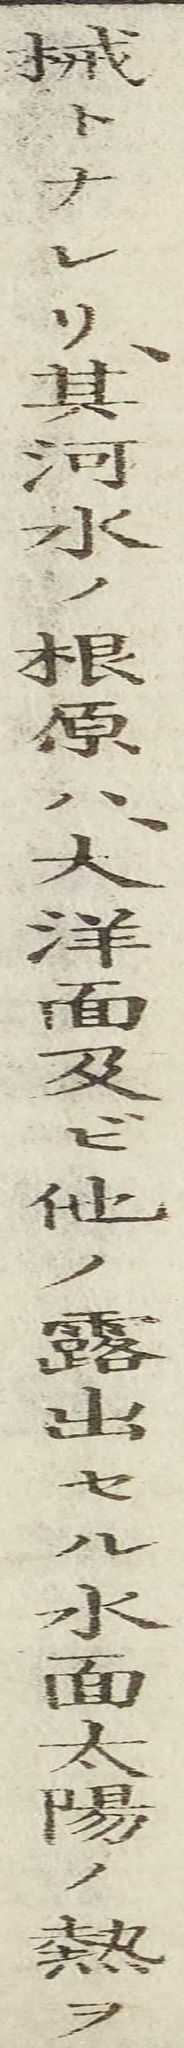械トナレリ、其河水ノ根原ハ、大洋面及ビ他ノ露出セル水面太陽ノ熱ヲ
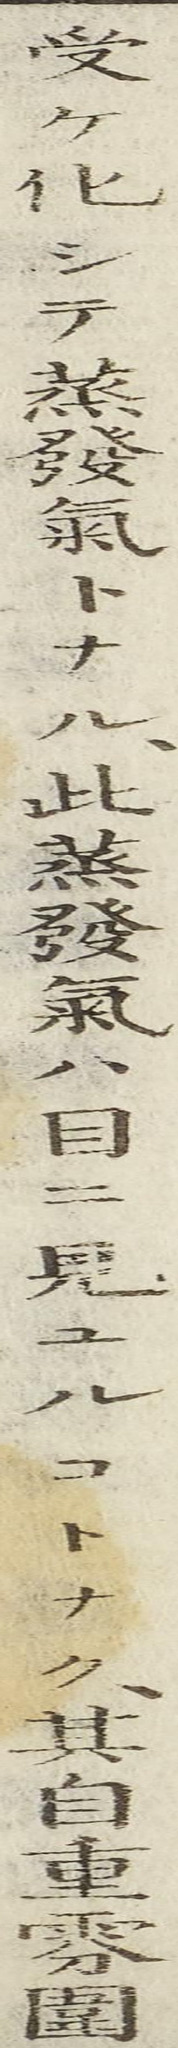受ケ化シテ蒸発気トナル、此蒸発気ハ目ニ見ユルコトナク、其自重雰囲

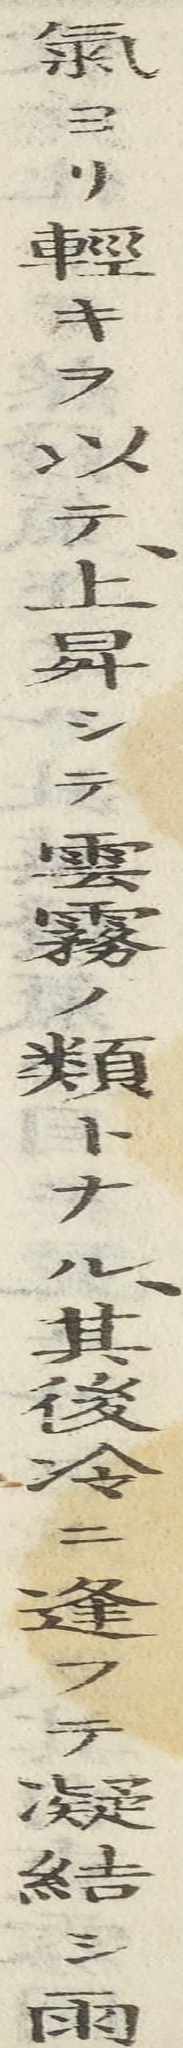気ヨリ軽キヲ以テ、上昇シテ雲霧ノ類トナル、其後冷ニ逢フテ凝結シ雨
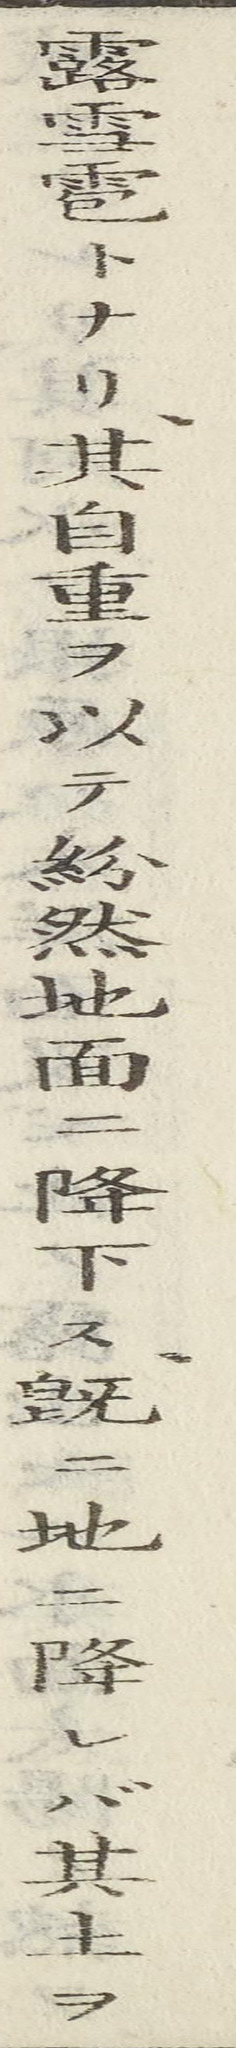露雪雹トナリ、其自重ヲ以テ紛然地面ニ降下ス、既ニ地ニ降レバ其土ヲ
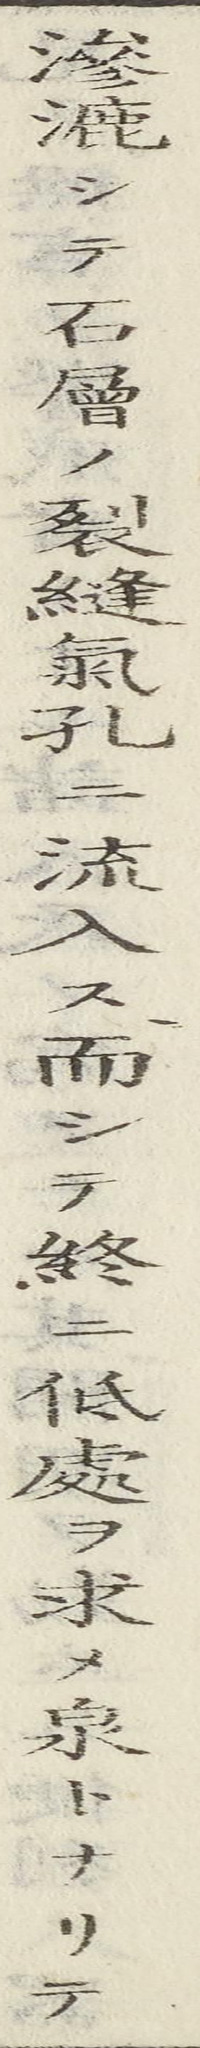惨漉シテ石層ノ裂縫気孔ニ流入ス、而シテ終ニ低処ヲ求メ泉トナリテ
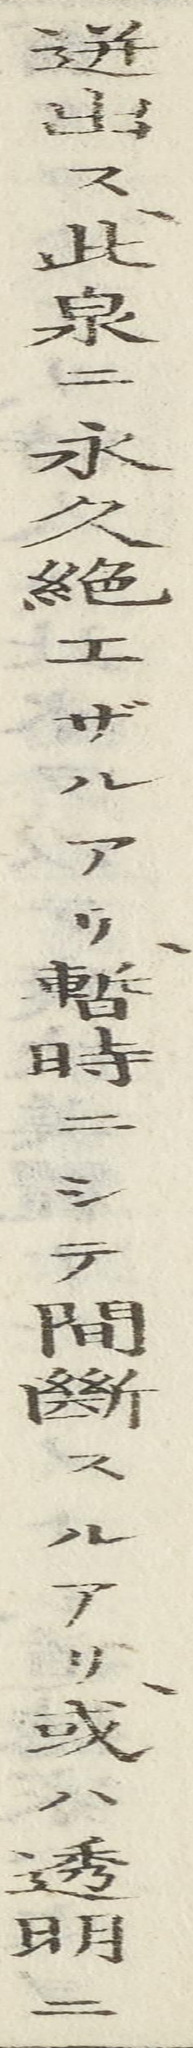迸出ス、此泉ニ永久絶エザルアリ、暫時ニシテ間断スルアリ、或ハ透明ニ
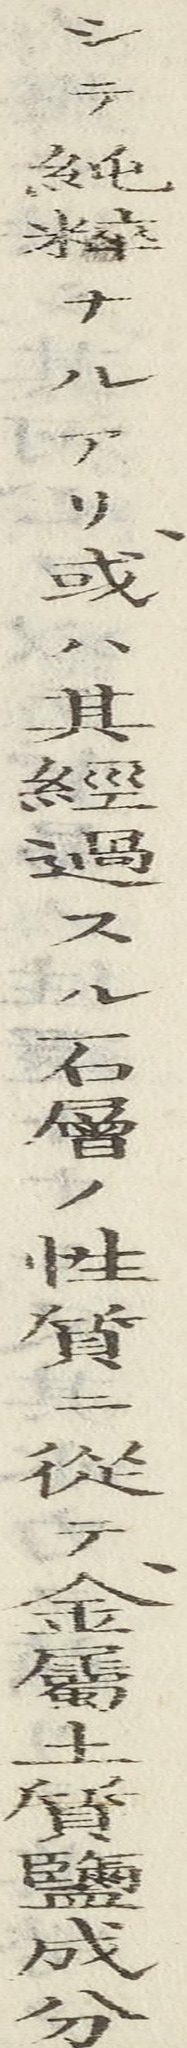シテ純粋ナルアリ、或ハ其経過スル石層ノ性質ニ従テ、金属土質塩成分
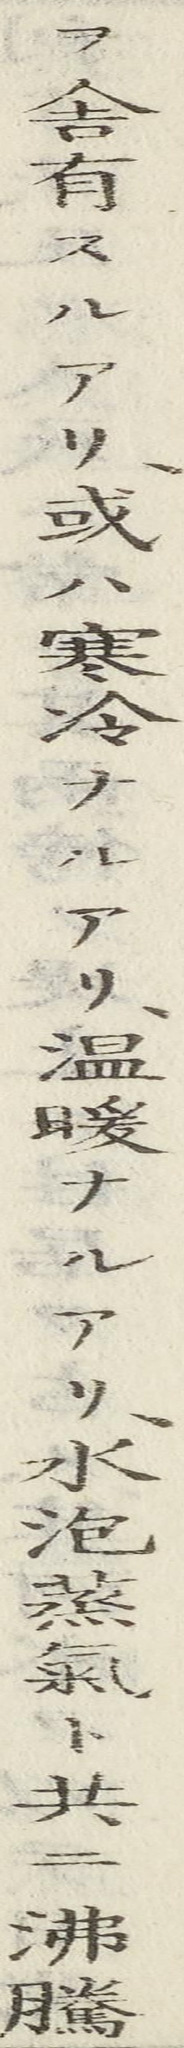ヲ舎有スルアリ、或ハ寒冷ナルアリ、温暖ナルアリ、水泡蒸気ト共ニ沸騰
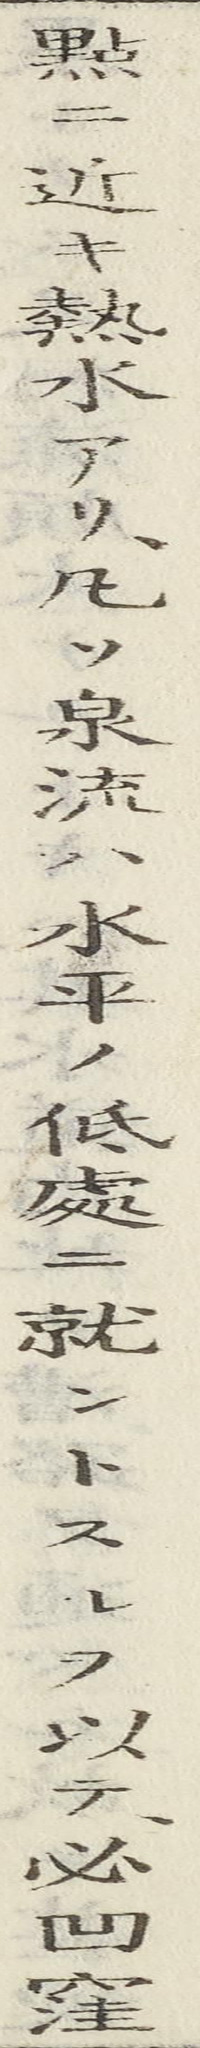点ニ近キ熱水アリ、凡ソ泉流ハ水平ノ低処ニ就ントスルヲ以テ、必凹窪
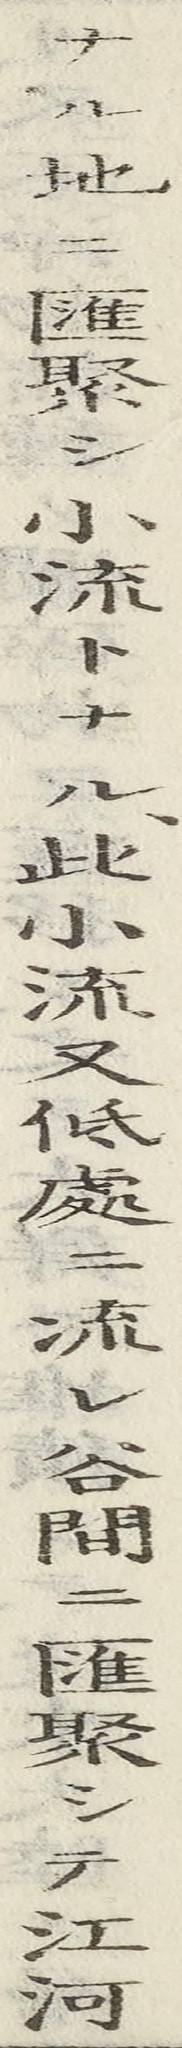ナル地ニ匯聚シ小流トナル、此小流又低処ニ流レ谷間ニ匯聚シテ江河
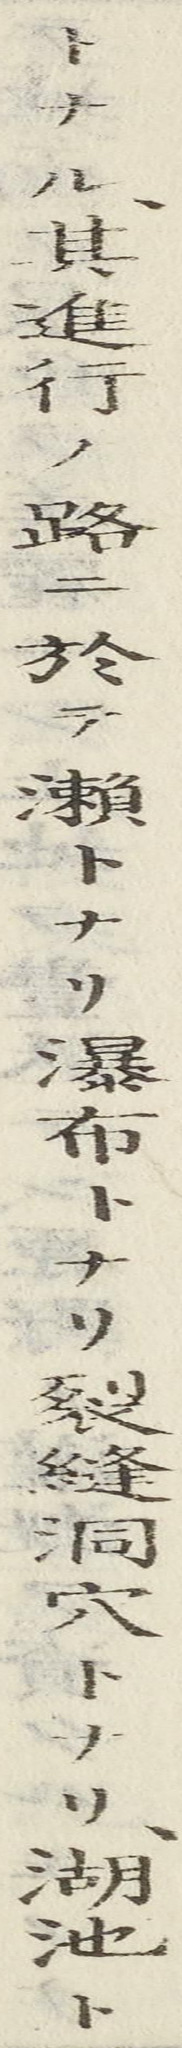トナル、其進行ノ路ニ於テ瀬トナリ瀑布トナリ裂縫洞穴トナリ、湖池ト
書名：百科全書　地文學　全
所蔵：東京大学地震研究所図書室 Earthquake Research Institute Library, The University of Tokyo, JAPAN
